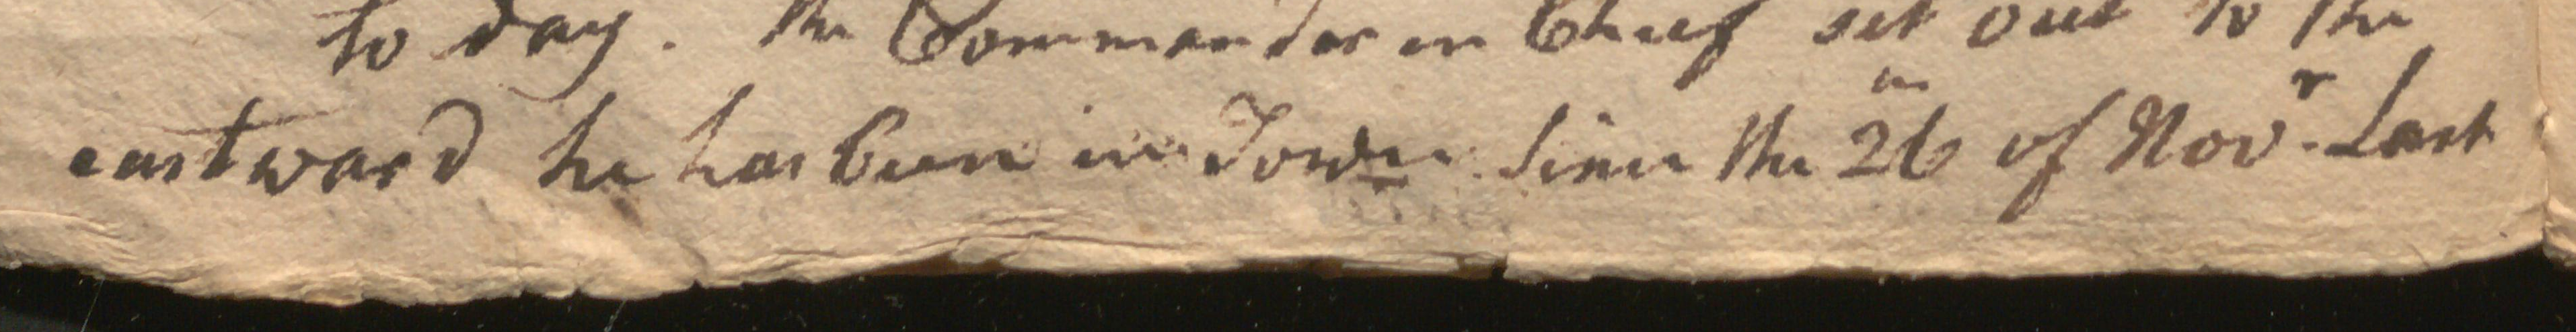eastward he has been in Town since the 26^th of Nov^r. Last
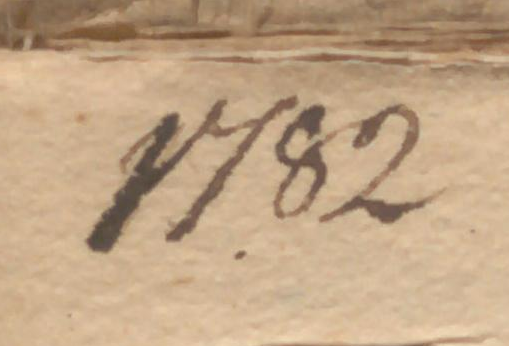1782
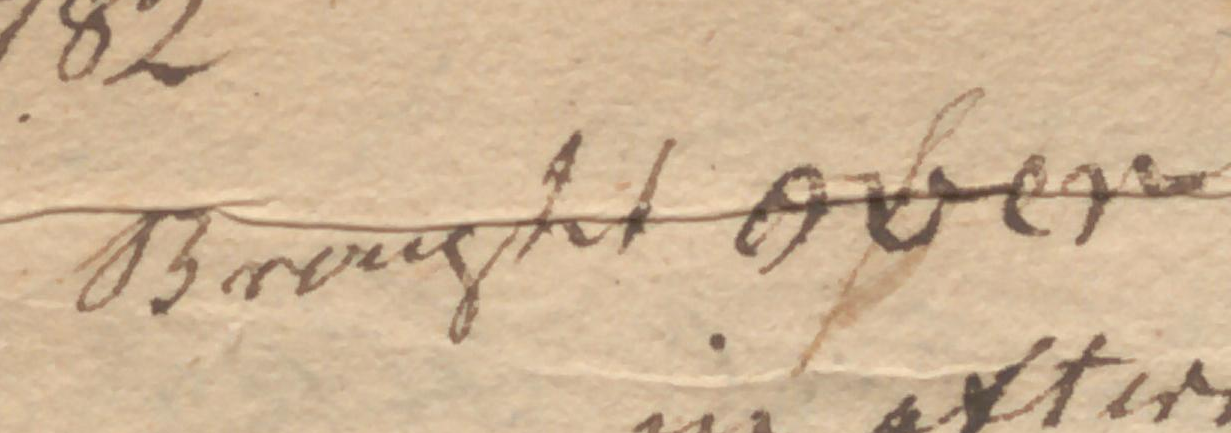Brought over
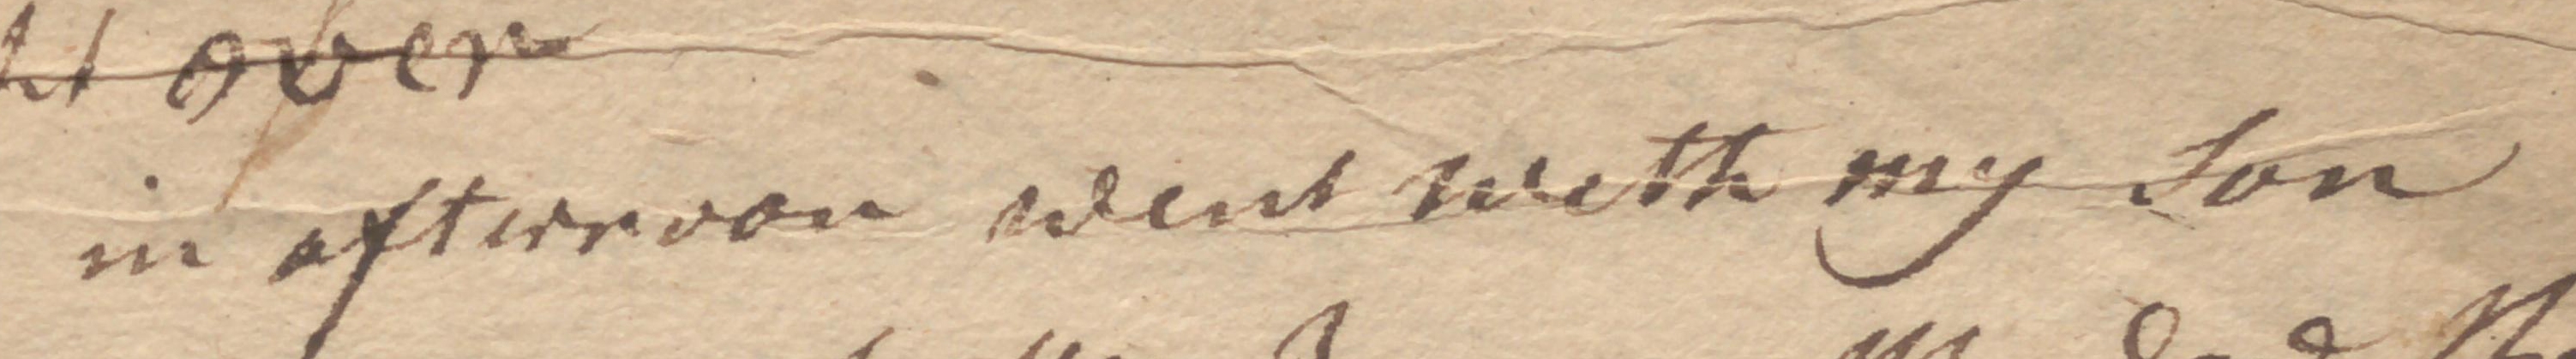in afternoon went with my son
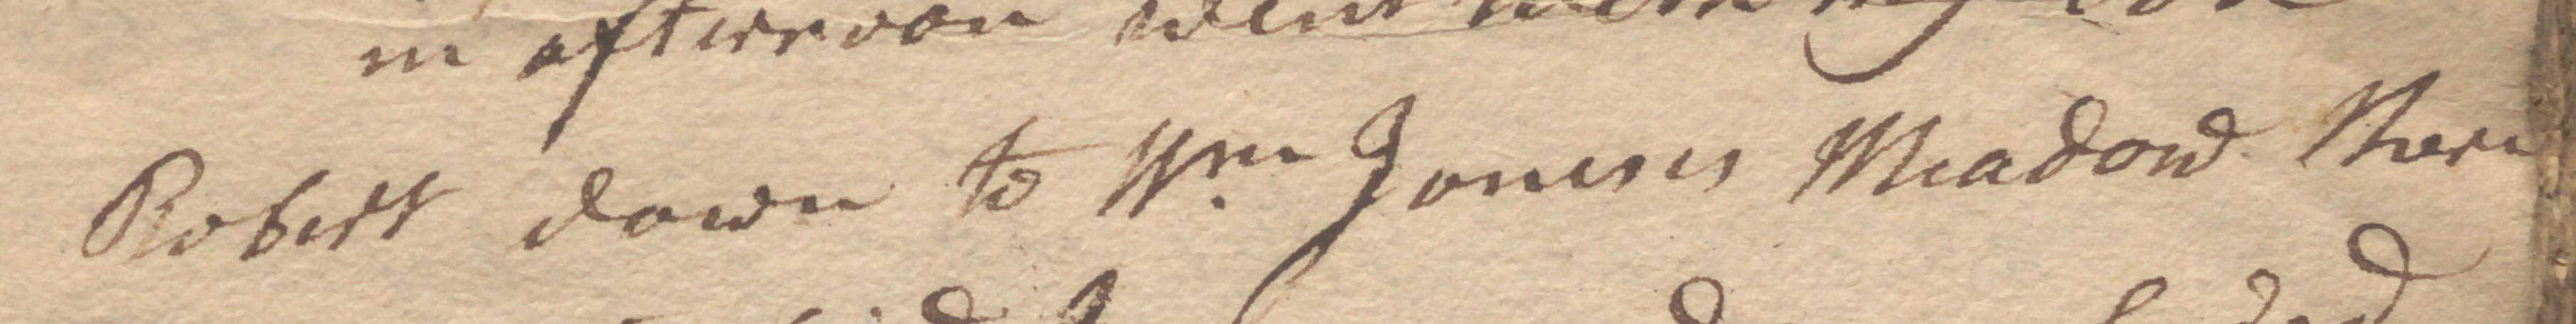Robert down to W^m. Joneses Meadow there
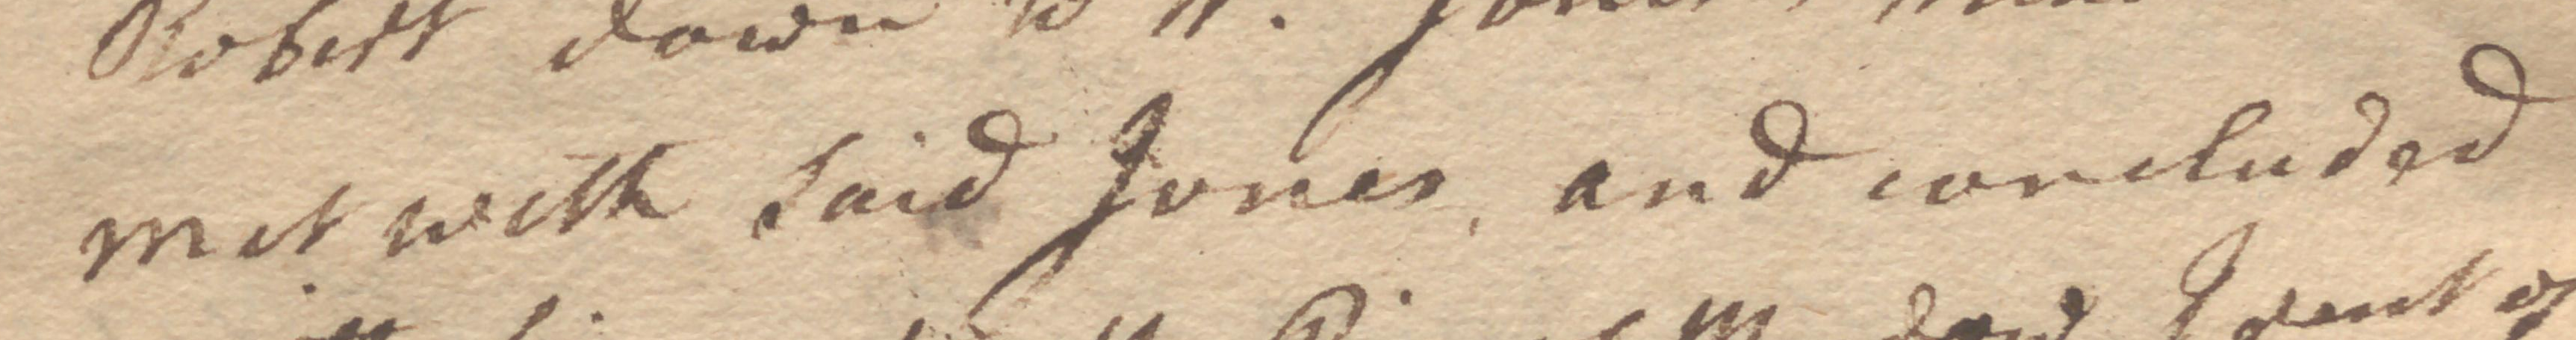met with said Jones, and concluded
